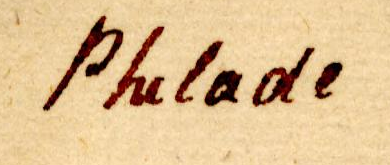Philade
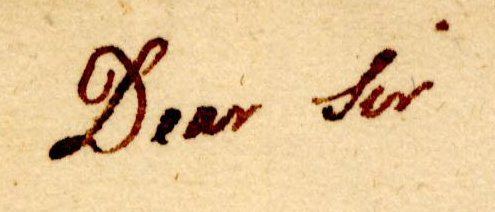Dear Sir
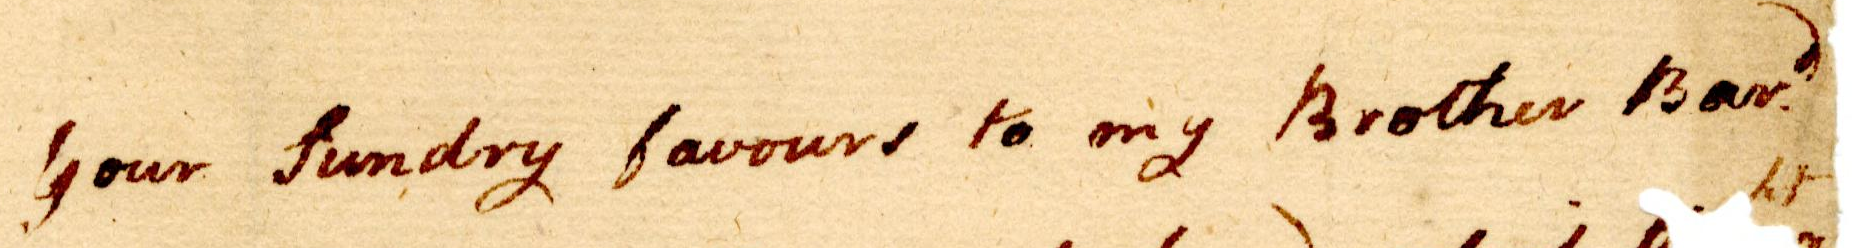Your Sundry favours to my Brother Bar^d
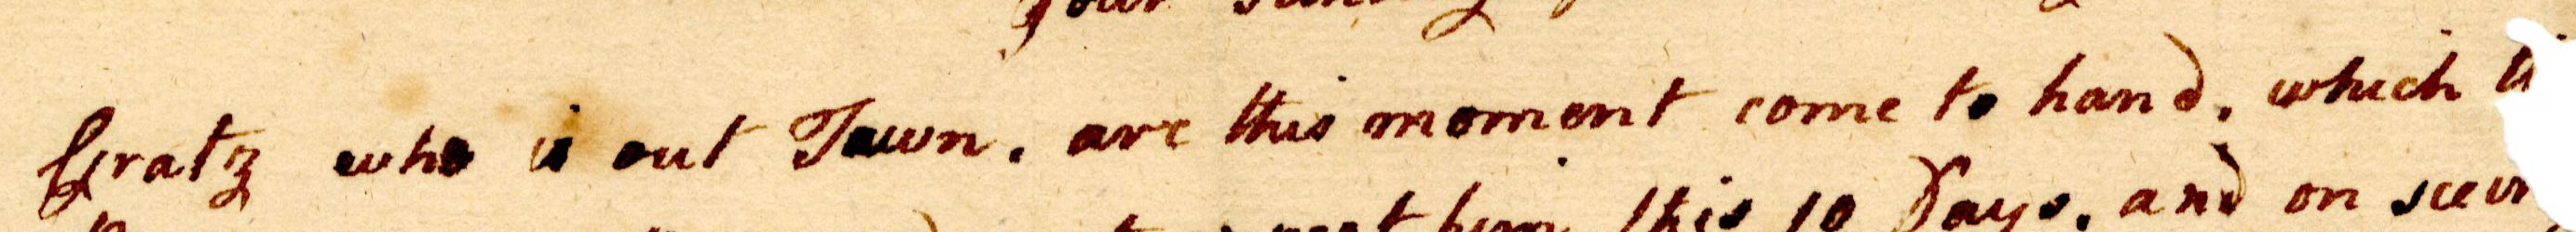Gratz who is out Tawn, are this moment come to hand, which is
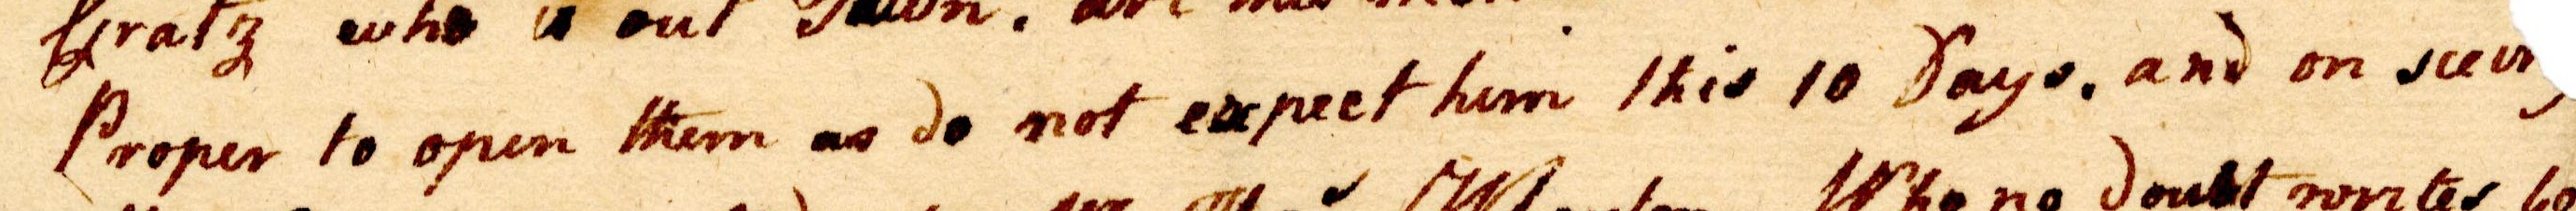Proper to open them as do not expect him this 10 Days, and on surv
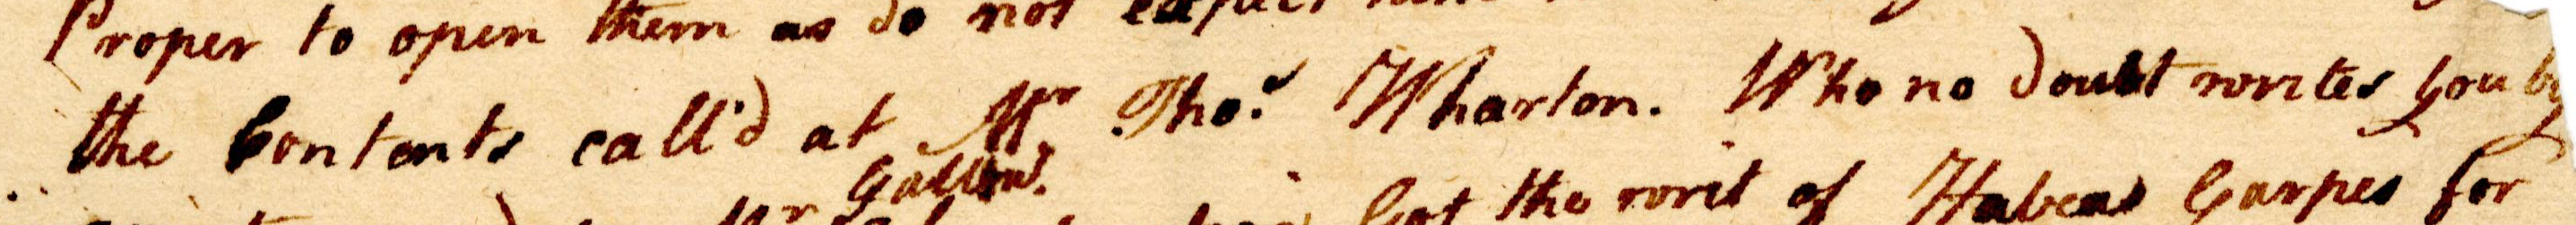the Contents call'd at M^r. Tho^s. Wharton. Who no doubt writes you t
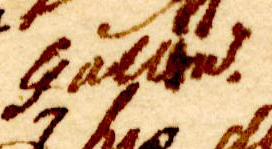Callow
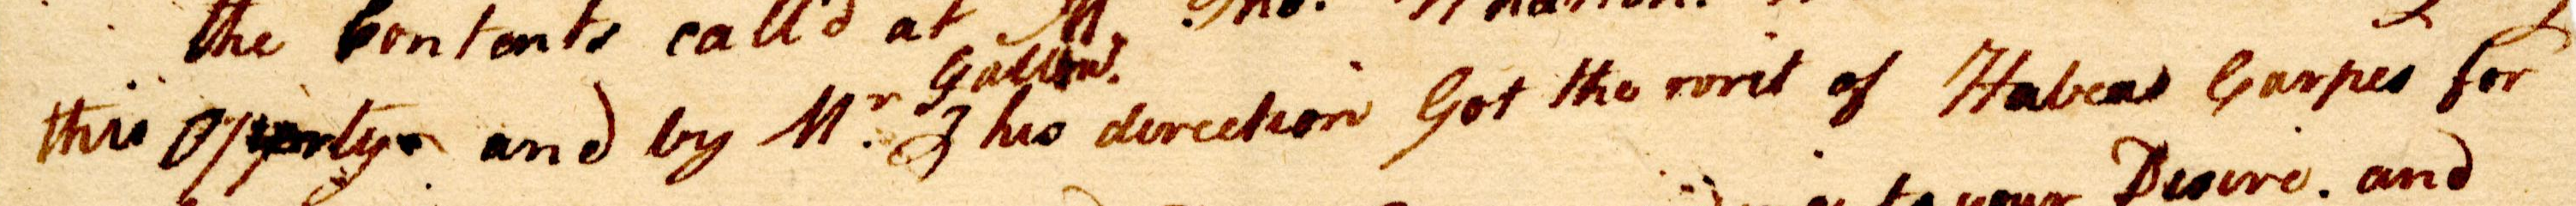this Oppty and by M^r. ^ his direction Got the writ of Habeas Corpes for
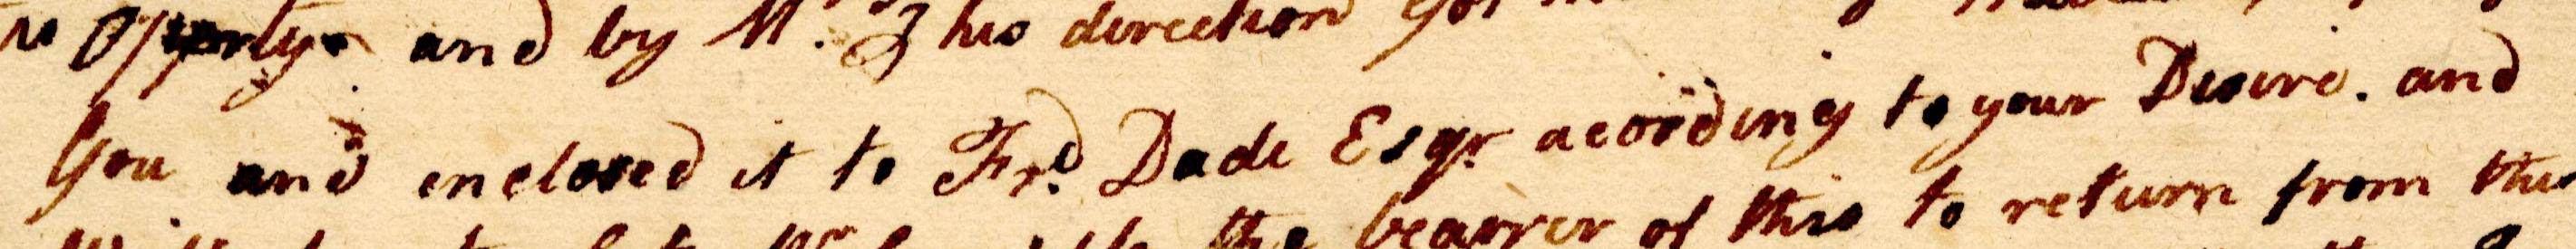You and enclosed it to Fr^d. Dade Esq^r. acording to your Desire and
